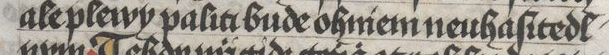ale plewy paliti bude ohníem neuhaſitedl¬
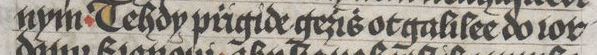nym.Tehdy pṙigide geżiṡ ot galilee do ior¬
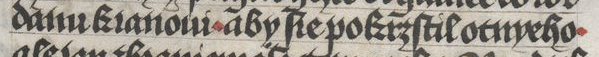danu kianoui.aby ſie pokrzſtil otnyeho.
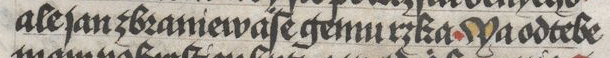ale Ian zbraniewaẛe gemu rzka.Ya odtebe¬
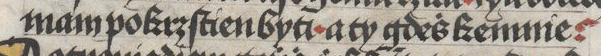mam pokrzſtien byti.a ty gdeṡ kemnie?
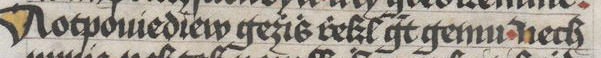A otpouiediew geżiṡ ṙekl ḡt gemu.Nech
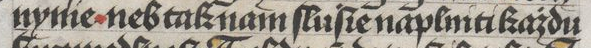nynie.neb tak nam ſluẛie naplniti każdu
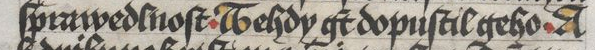ſprawedlnoſt.Tehdy ḡt dopuſtil geho.A
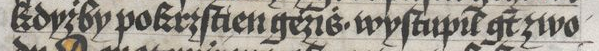kdyżby pokrzſtien geżiṡ.wyſtupil ḡt zwo¬
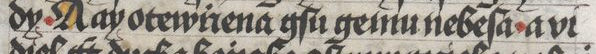dy.A ay otewṙíena gſu gemu nebeſa.a vi¬
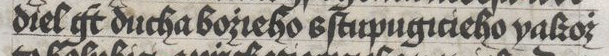diel ḡt ducha bożieho sſtupugicieho yakoż¬
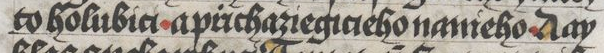to holubici.a prichaziegicieho nanieho.A ay
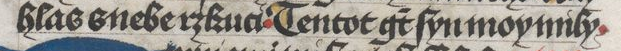hlas snebe rzkuci.Tentot ḡt ſyn moy mily.
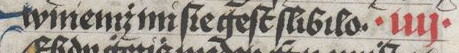wniemż mi ſie geſt ſlibilo.iiij.
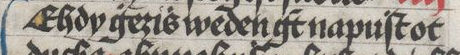Ehdy geziṡ weden ḡt napuẛt ot
